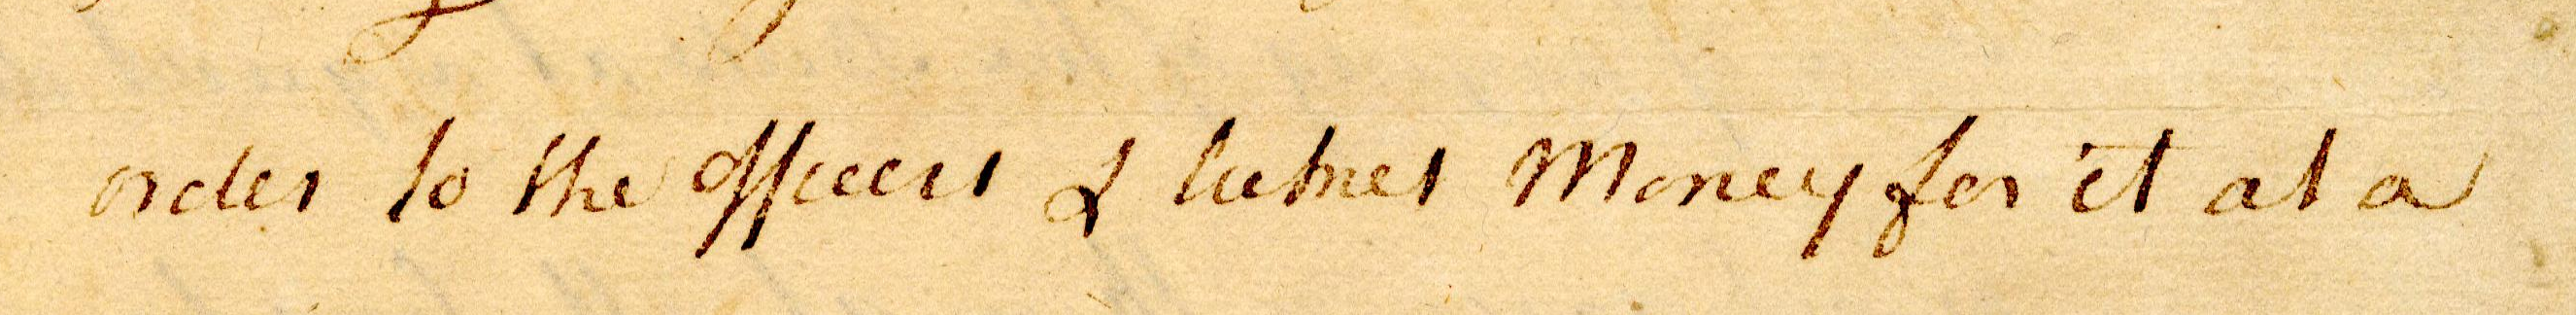notes to the officers & Cashes Money for it at a
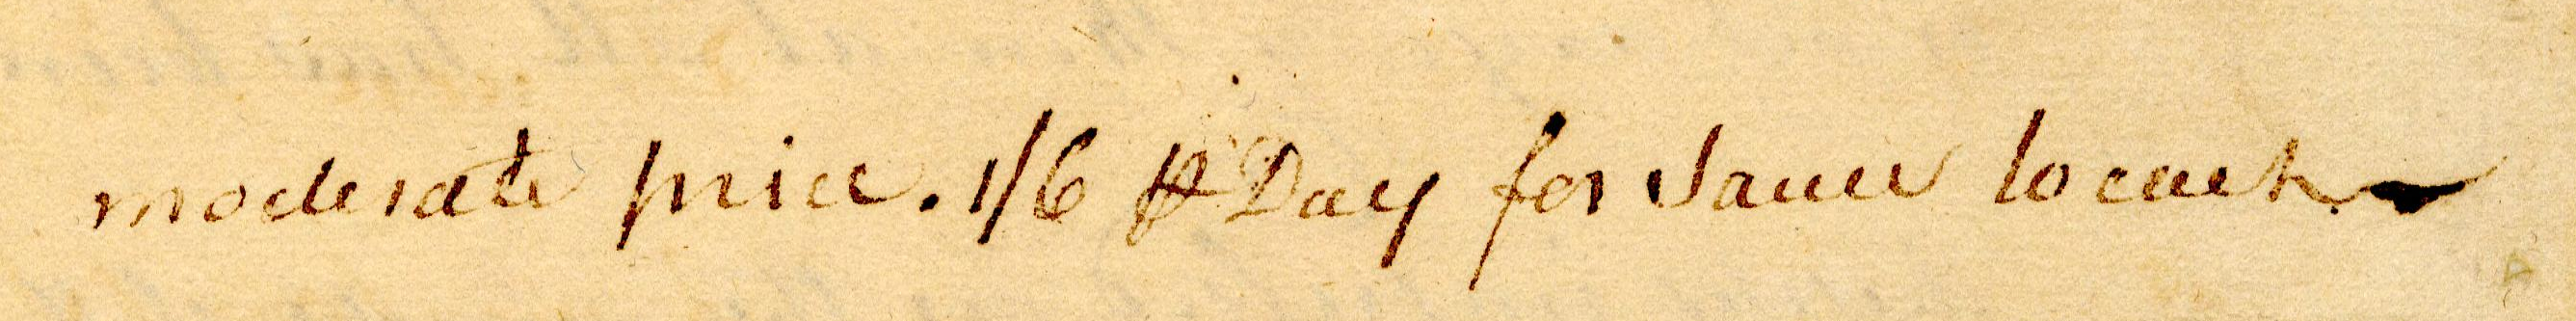moderate price. 1/6 per Day for Sauce to each
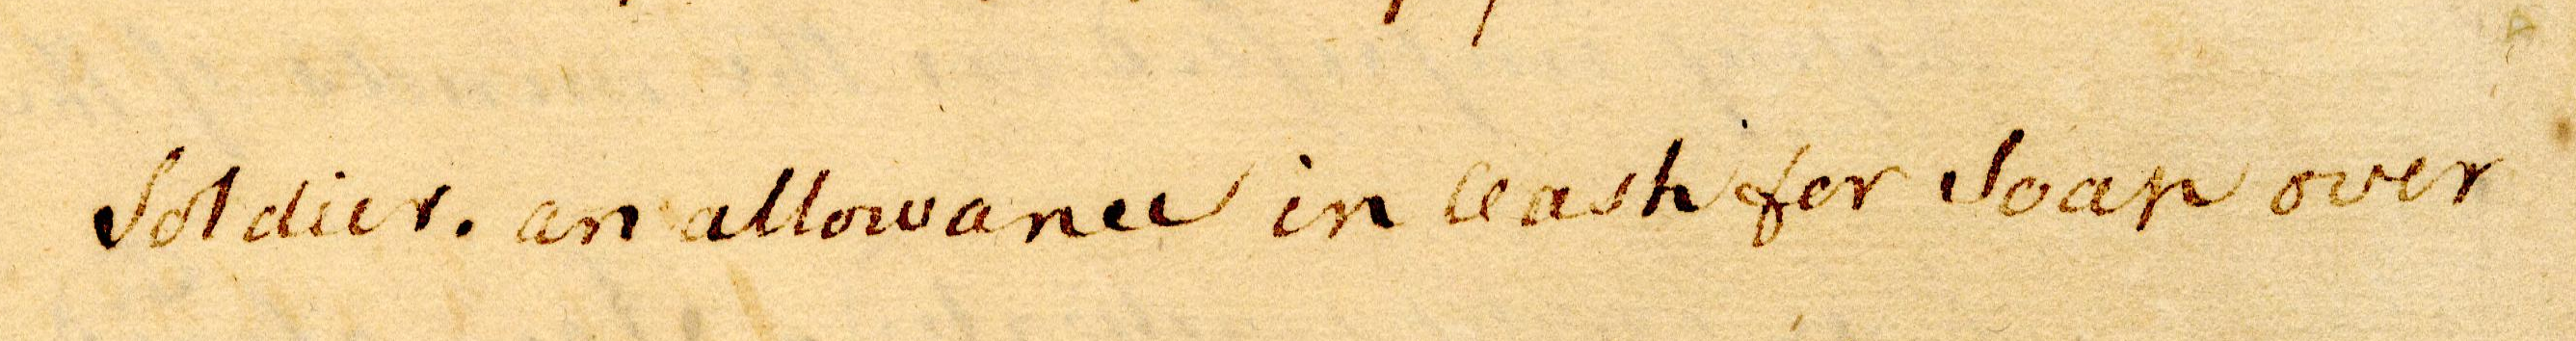Soldier. an allowance in cash for Soap over
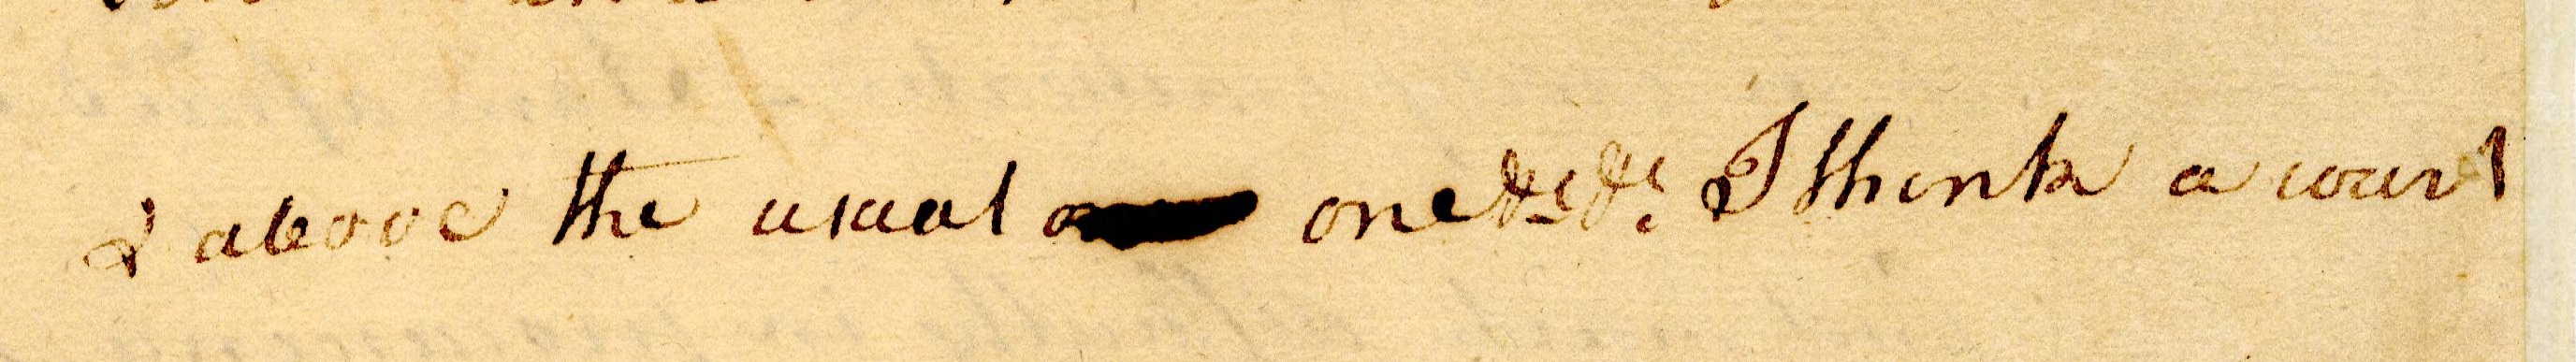& above the usual [__] one &^c &^c. I think a court
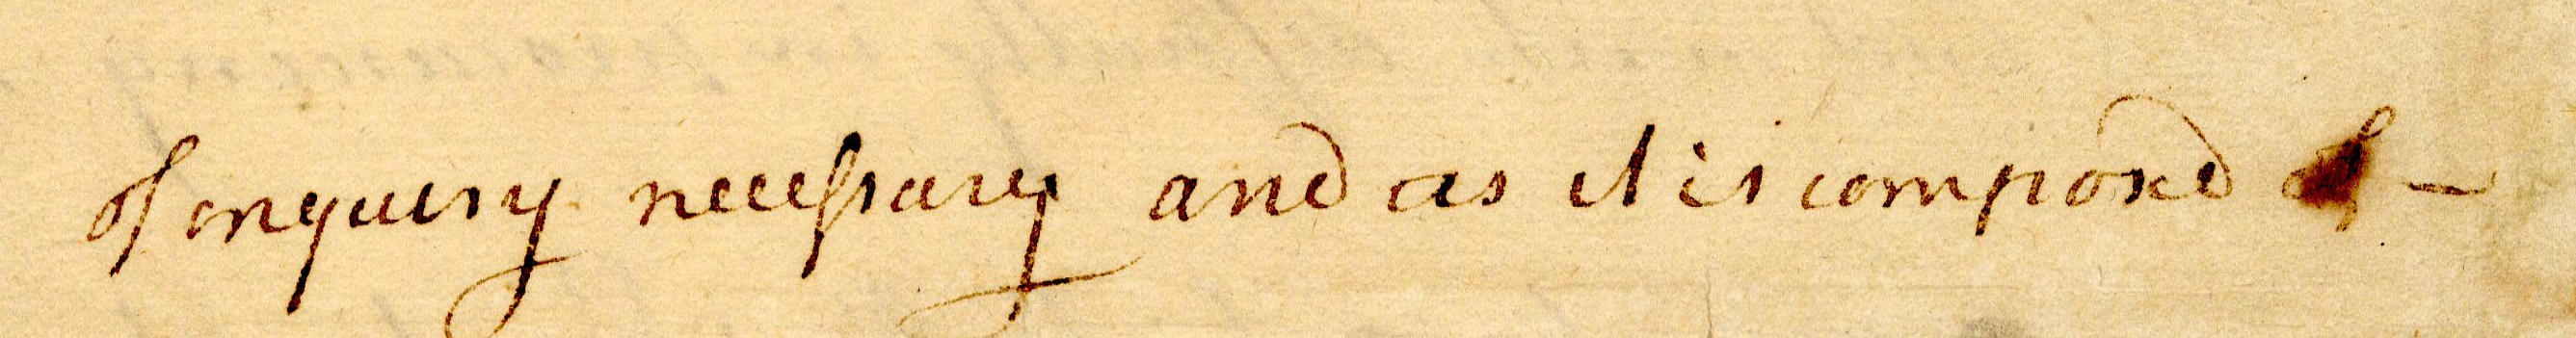of enquiry necessary and a 1 is composed of-
